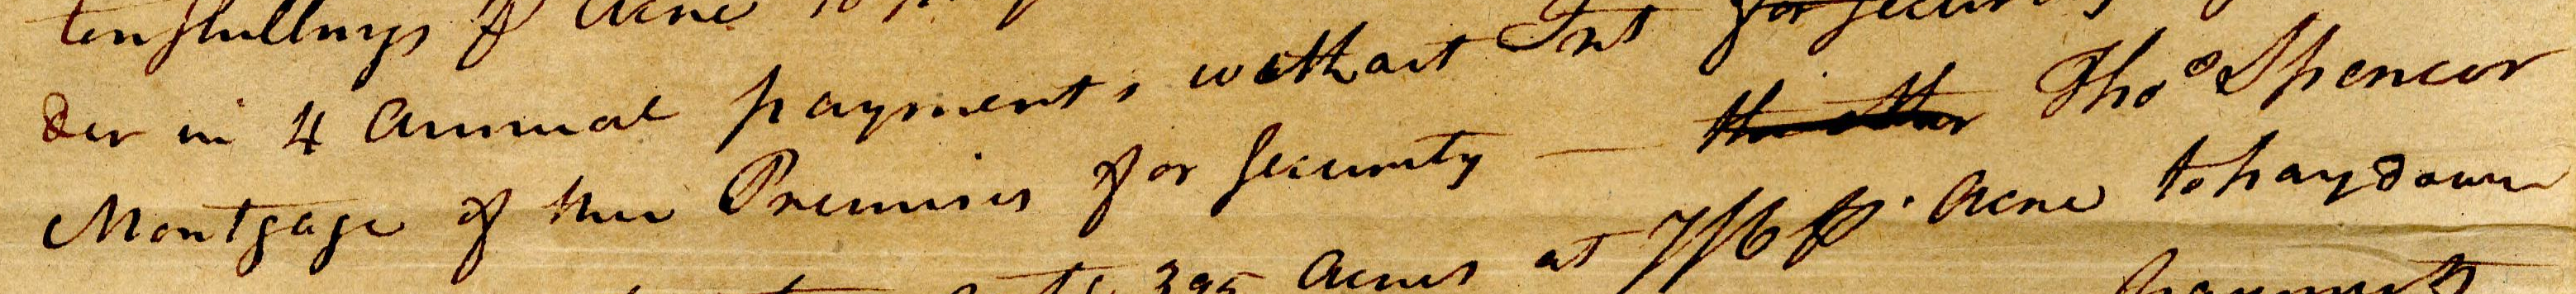Mortgage of the Premises for security- [the other] Tho^s Spencer
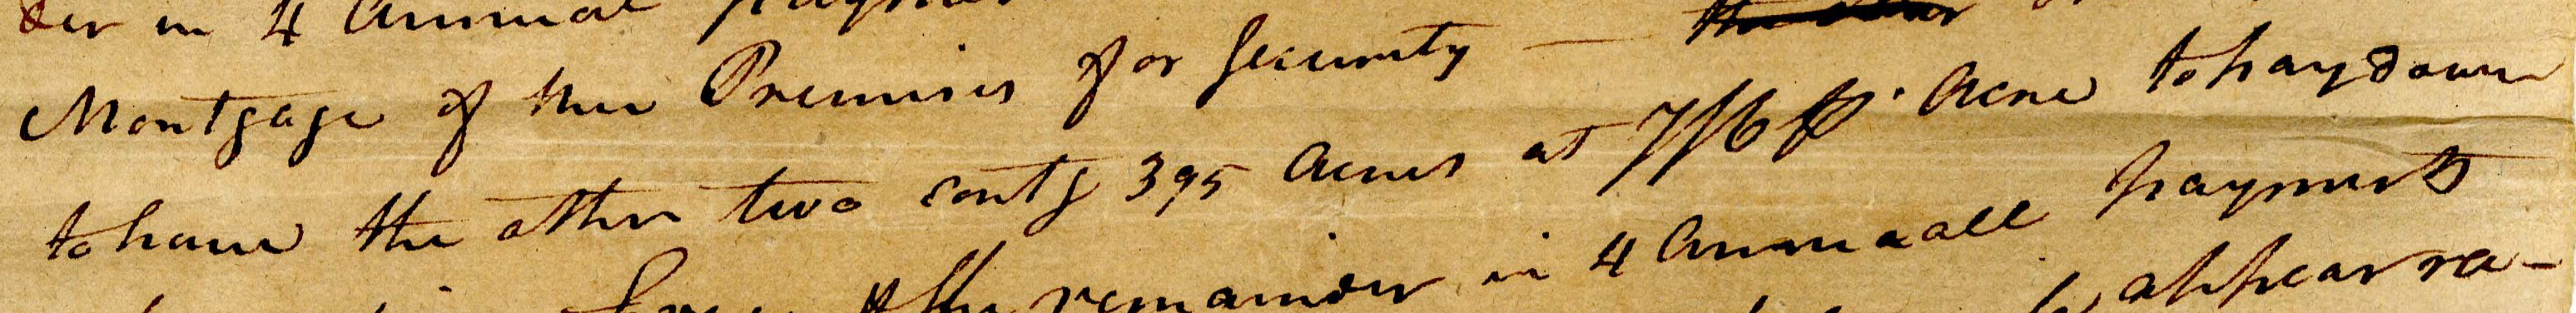to have the other two contg 395 acres at 776 per acre to pay down
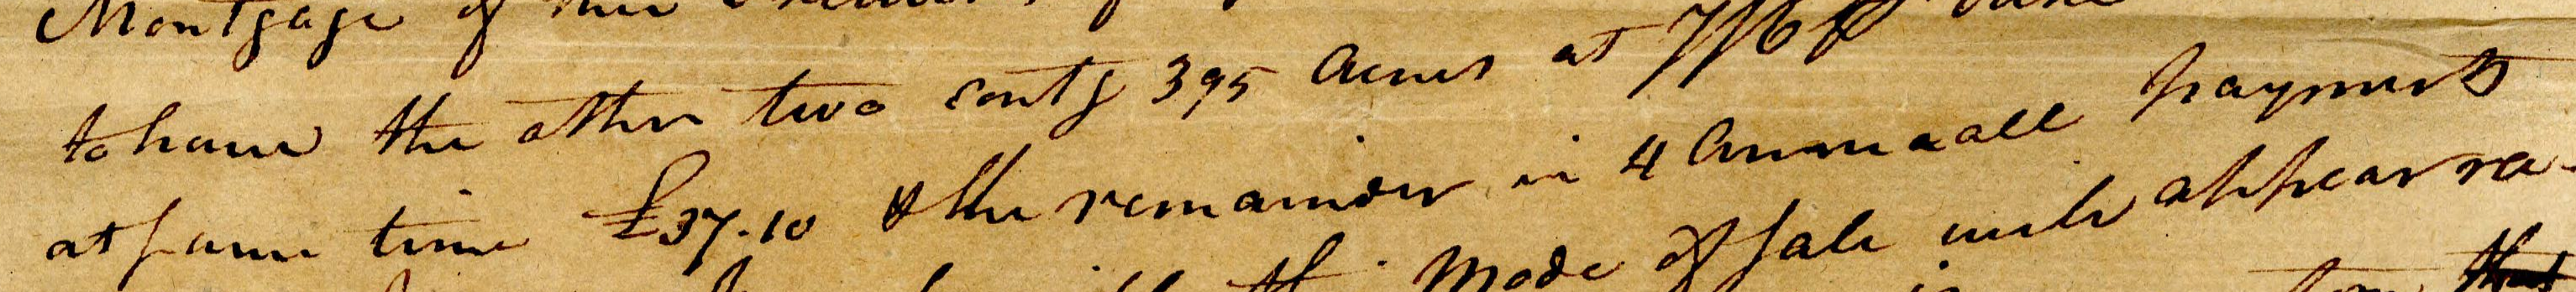at same time £ 37.10 & the remainder in 4 annuall payments
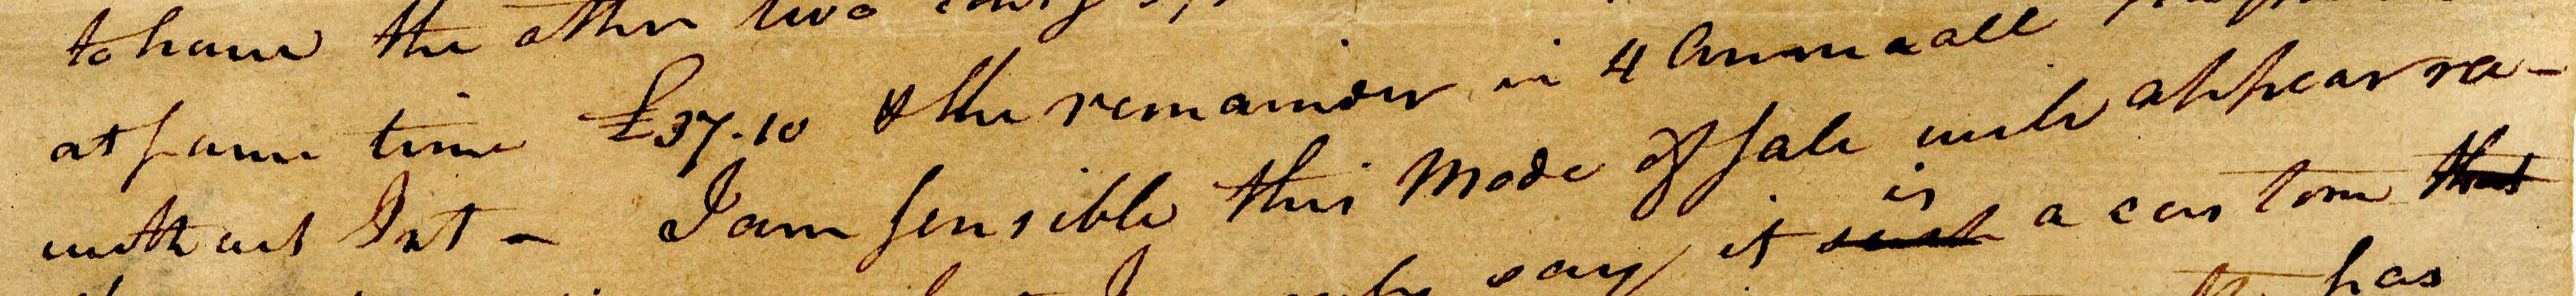without Int- I am sensible this mode of sale will appear ra-
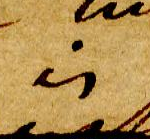is
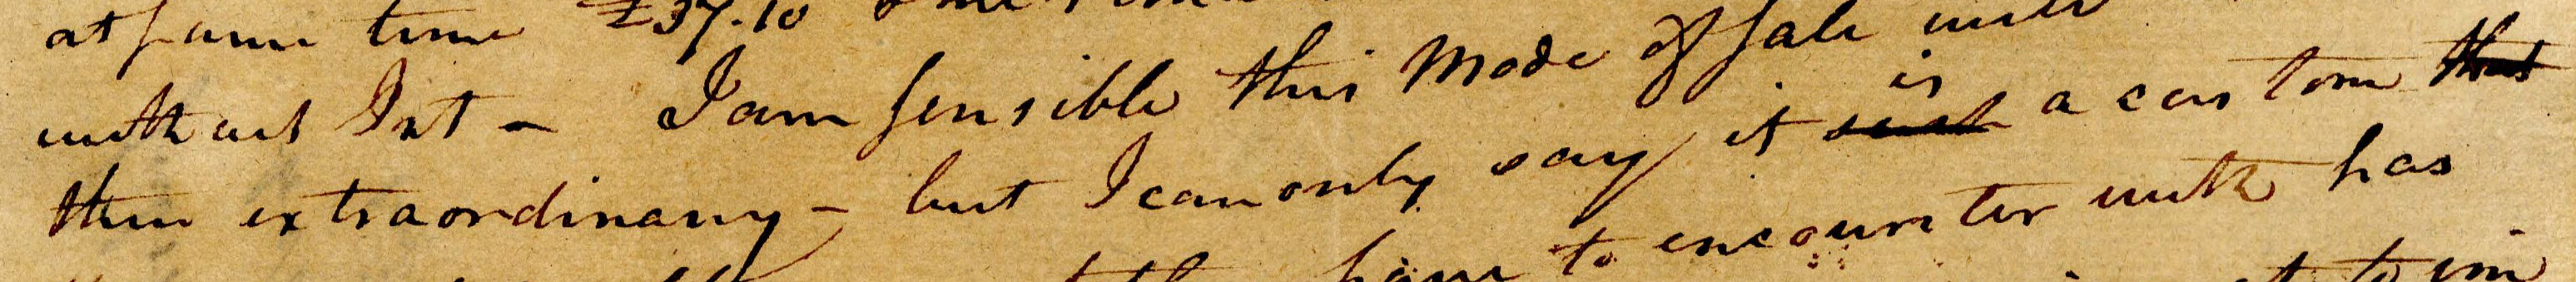then extraordinary - but I can only say it [such] a custom [that]
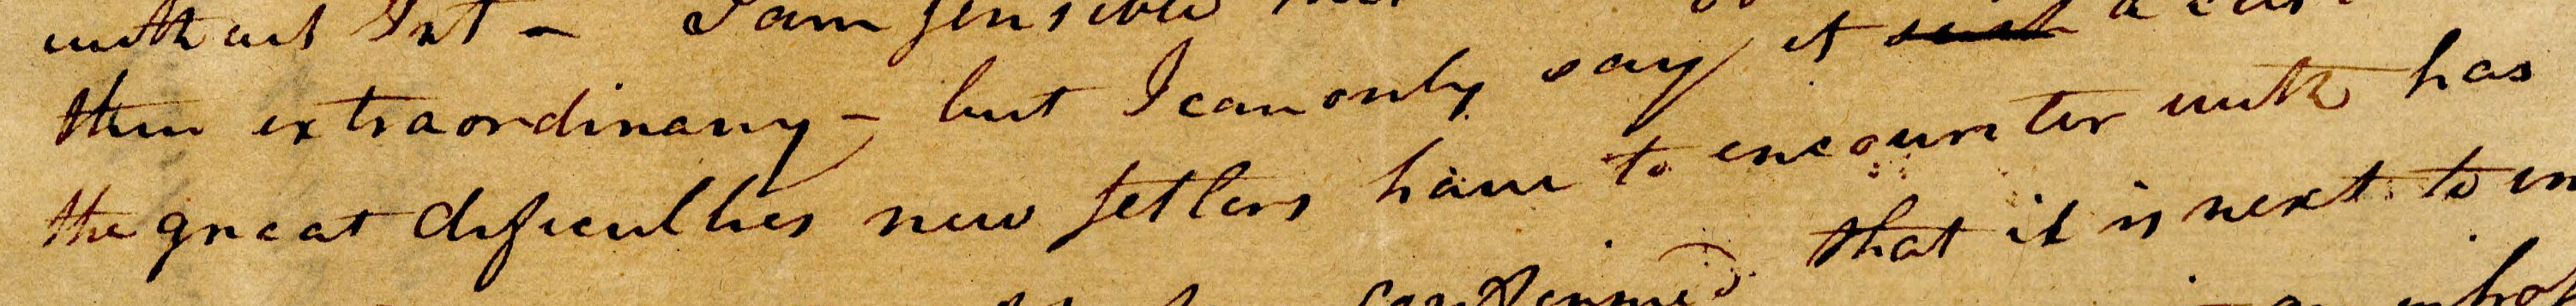the great dificulties new setlers have to encounter with has
